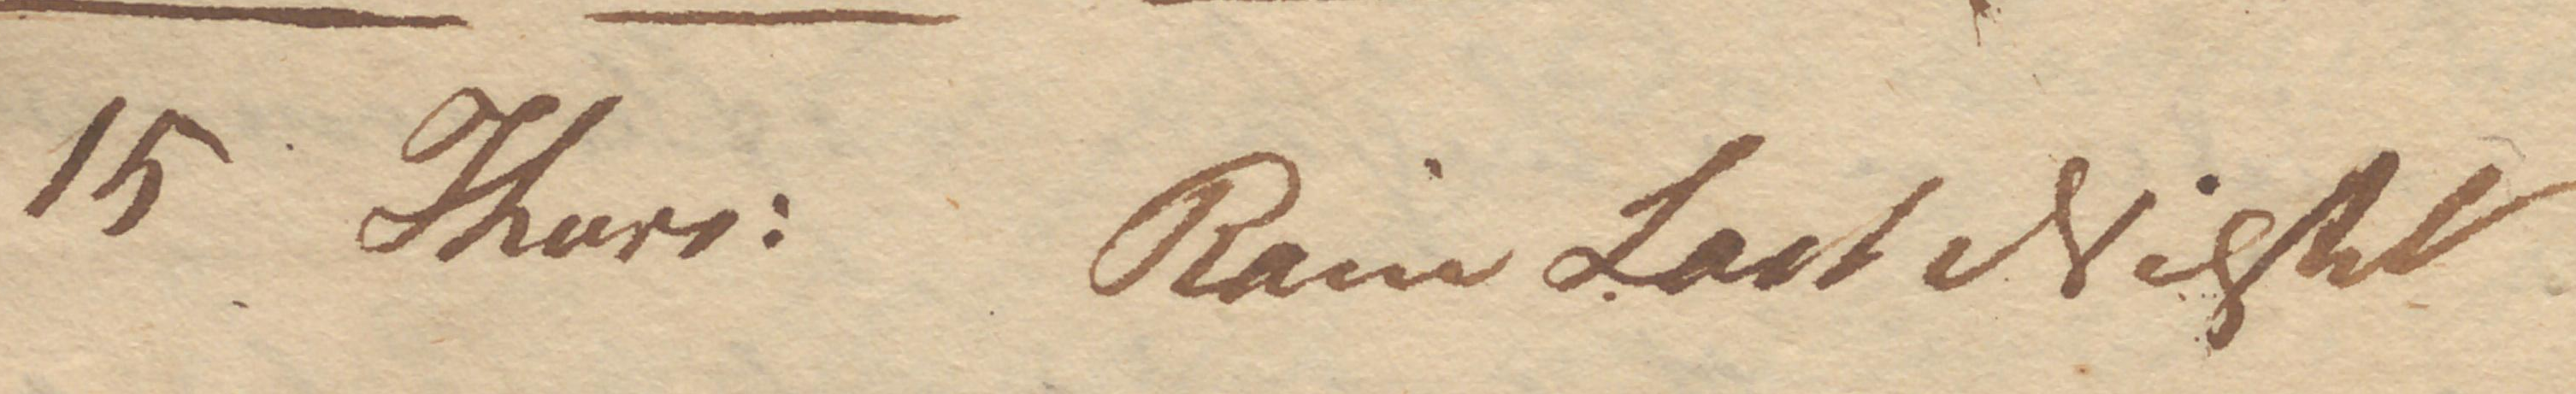15 Thurs: Rain Last Night
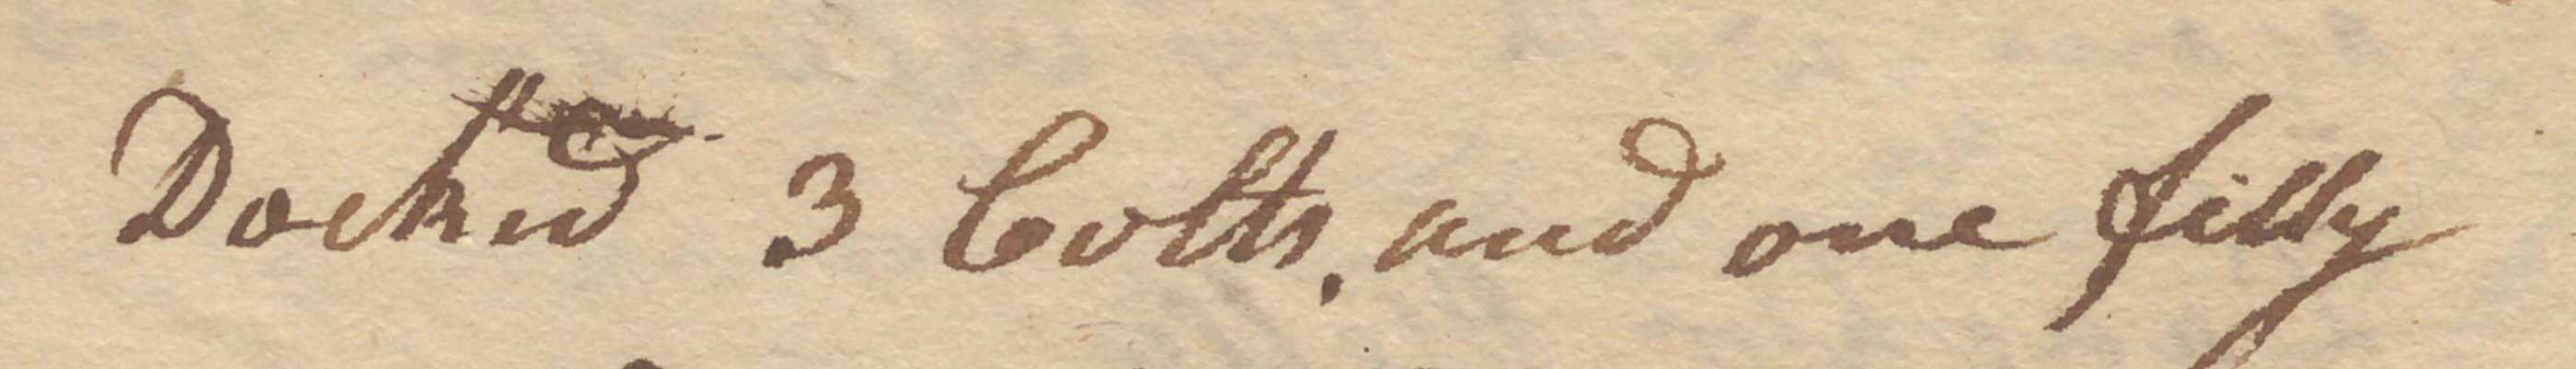Docked 3 Colts and one filly
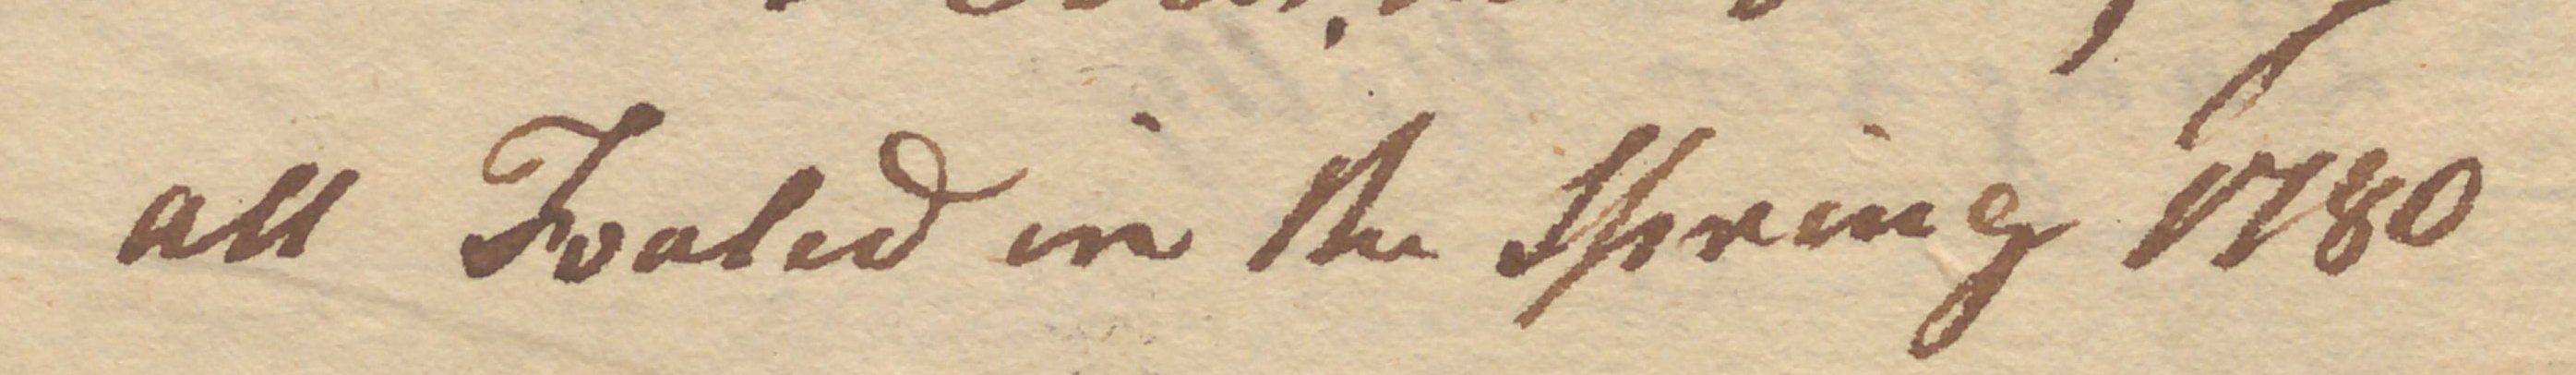all Foaled in the Spring 1780
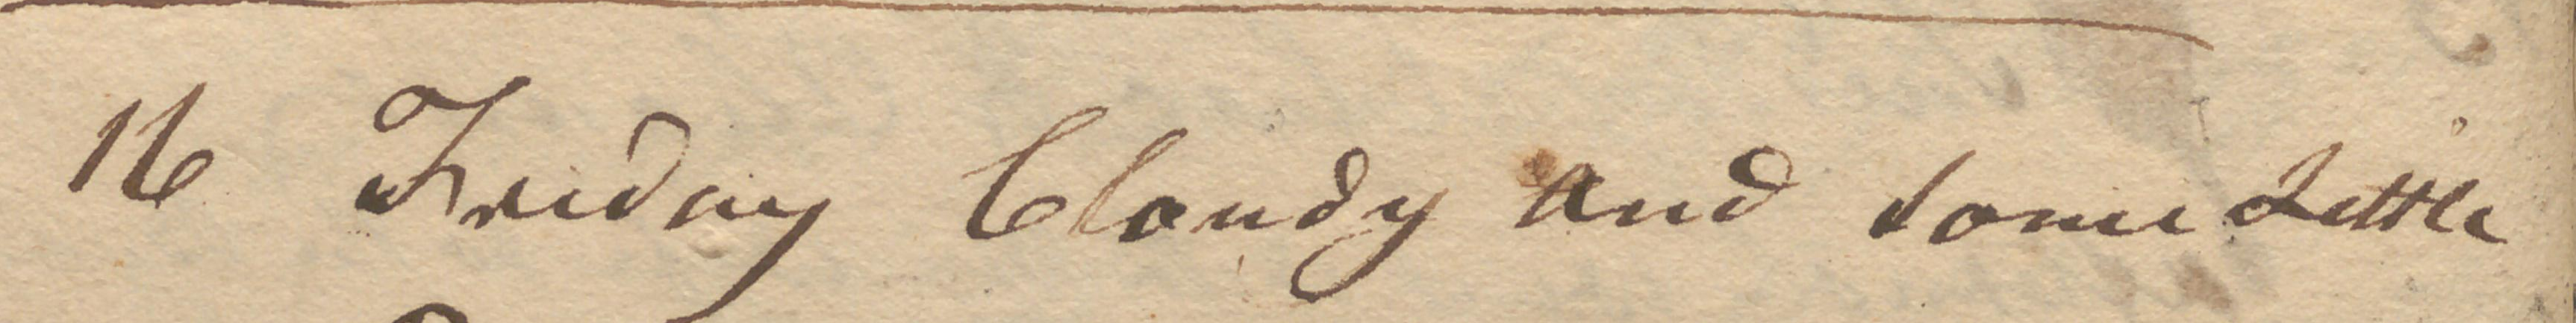16 Friday Cloudy and some Little
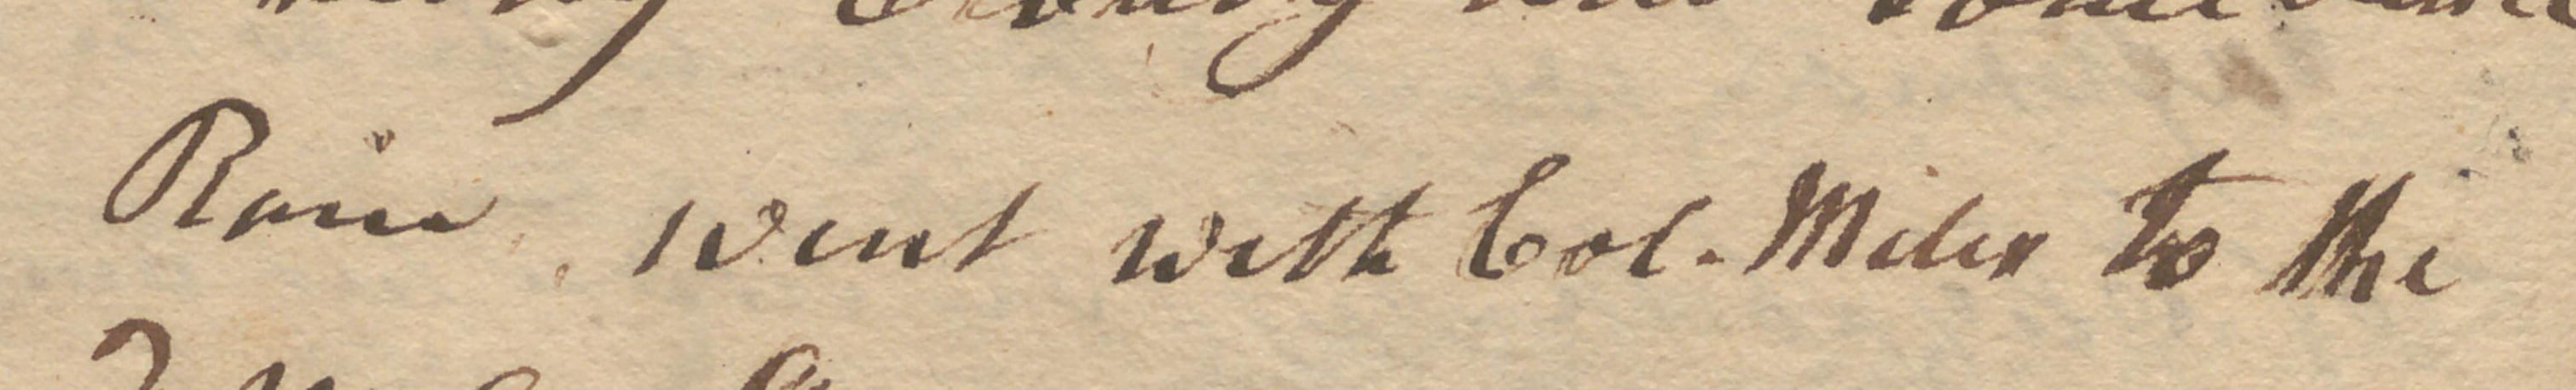Rain went with Col. Miles to the
